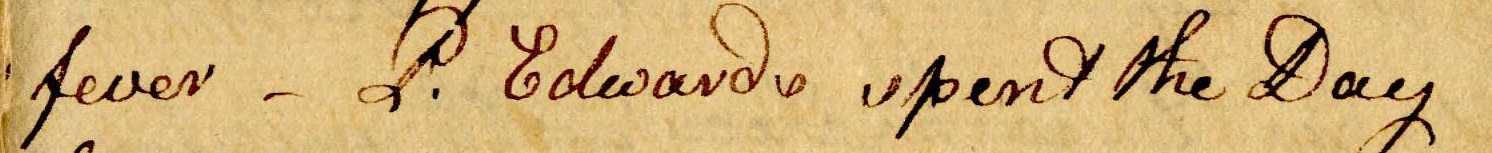fever- P. Edwards spent the Day
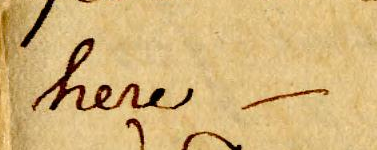here-
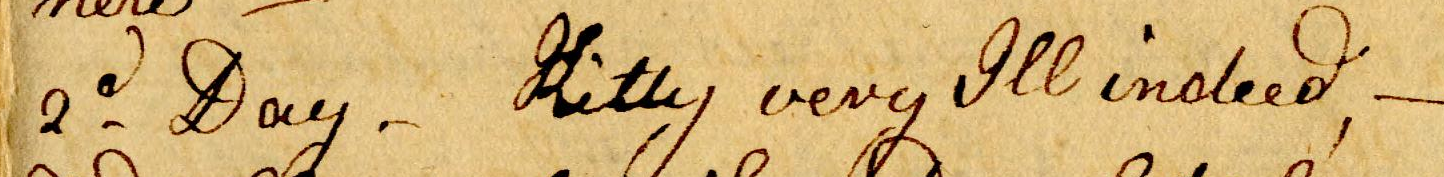3^d. Day- Kitty very Ill indeed-
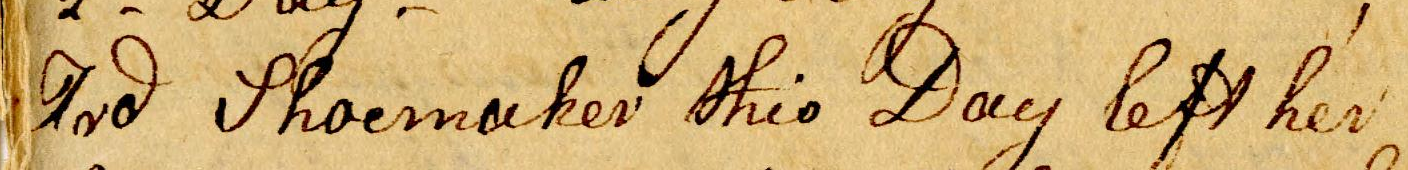Frd Shoemaker this Day left her
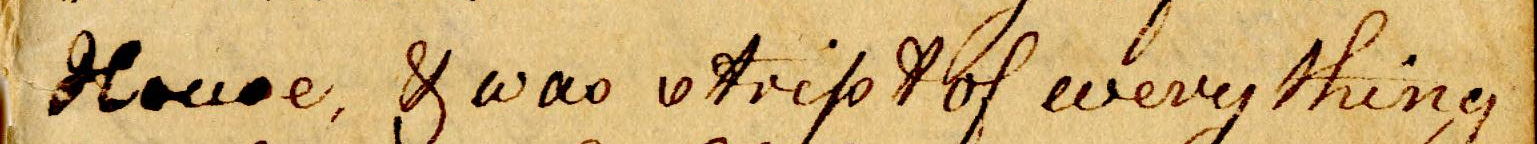House, & was stript of everything
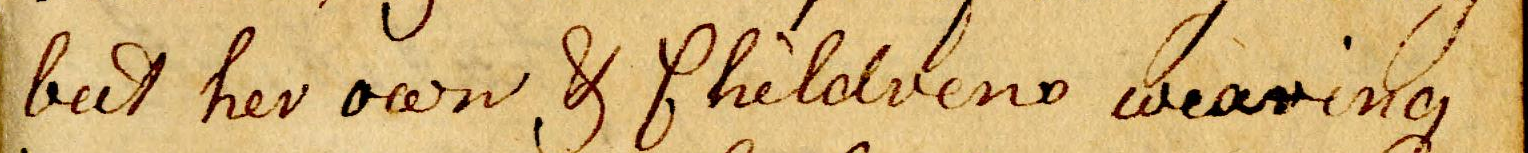but her own & Childrens wearing
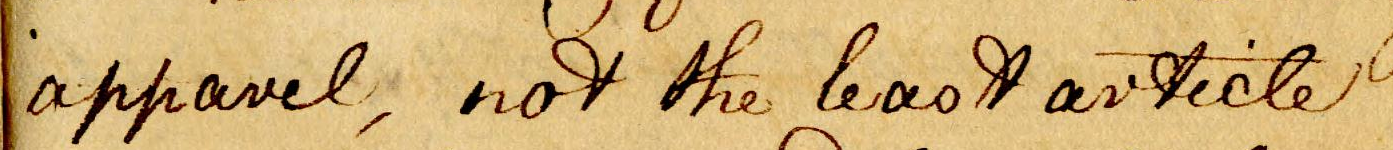apparel, not the least article
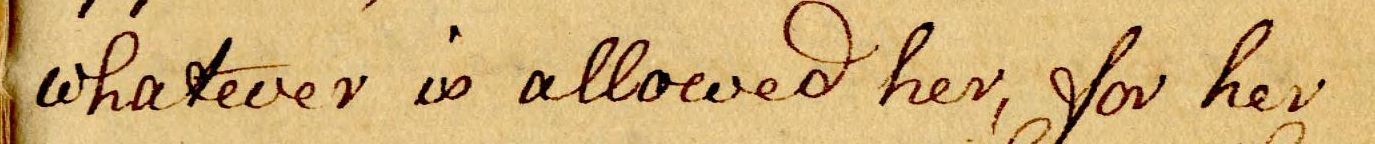whatever is allowed her, for her
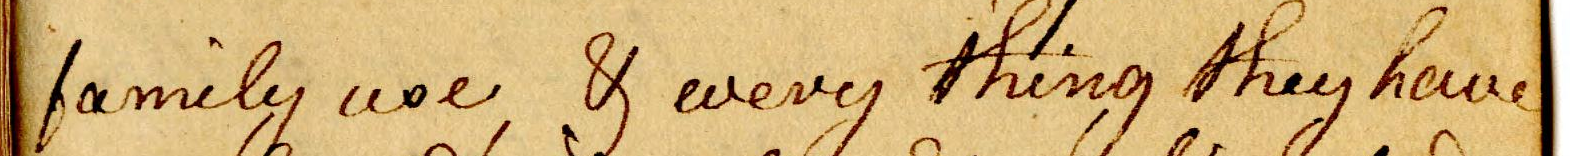family use, & every thing they have
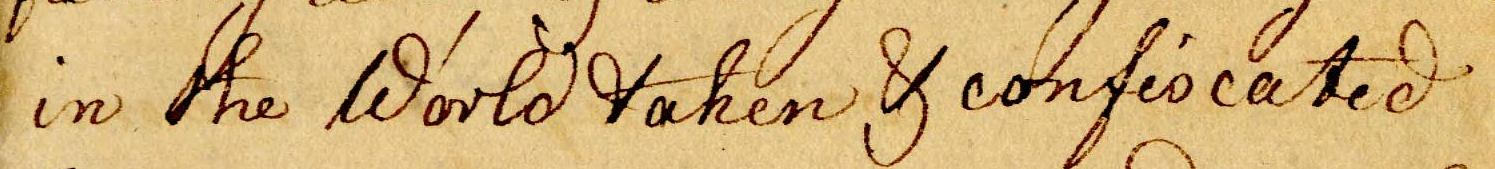in the World taken & confiscated
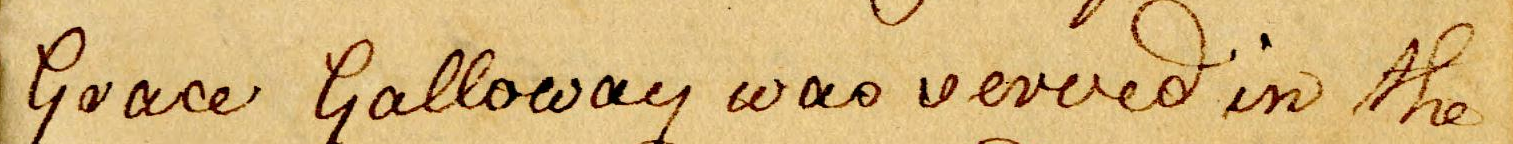Grace Galloway was served in the
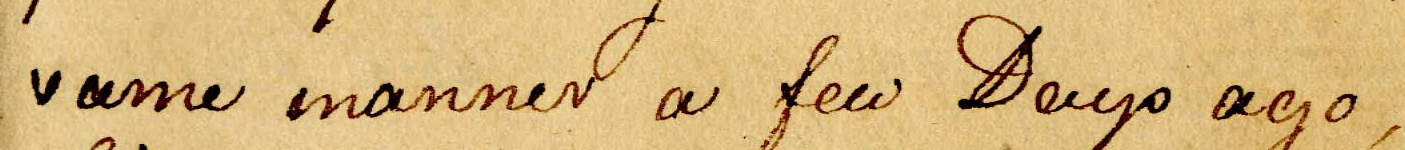same manner a few Days ago,
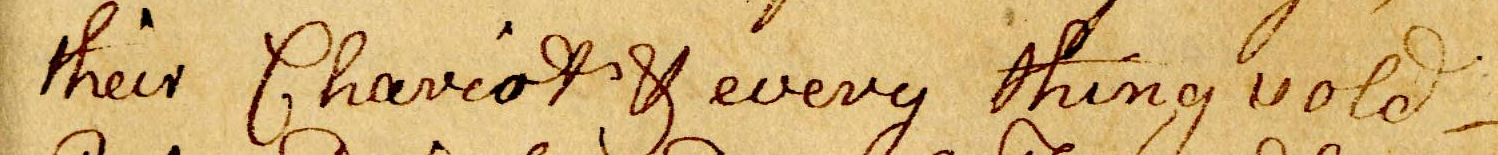their Chariot & every thing sold-
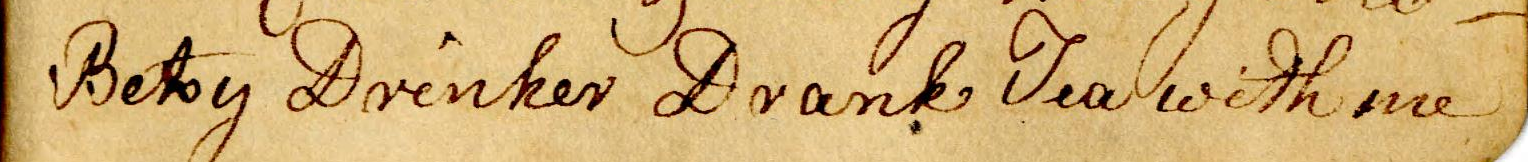Betsy Drinker Drank Tea with me
